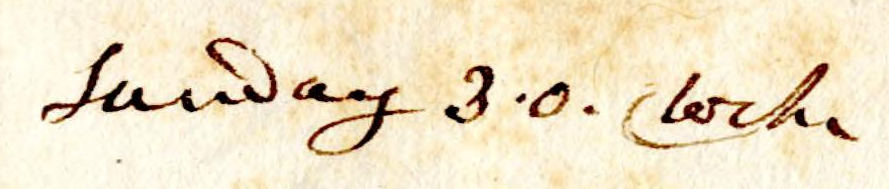Sunday 3. o.Clock
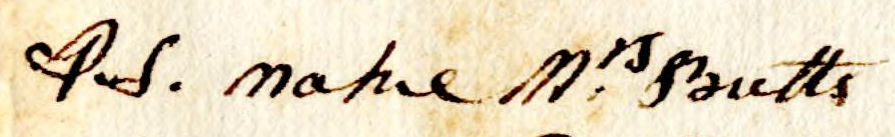P.S. make M^rs. Paretts
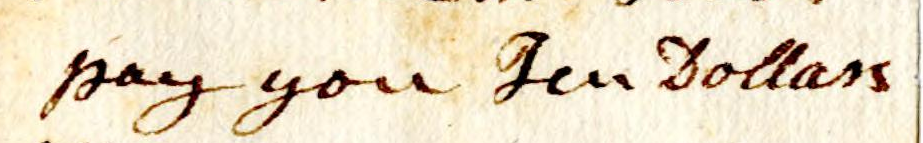pay you Ten Dollars
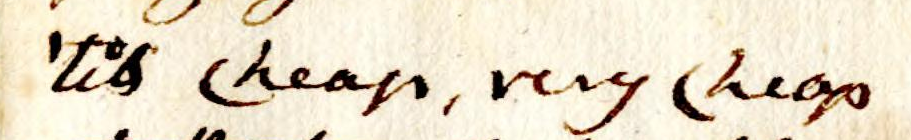'tis cheap, very Cheap
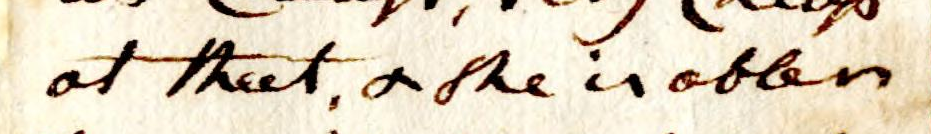at that, & she is abler
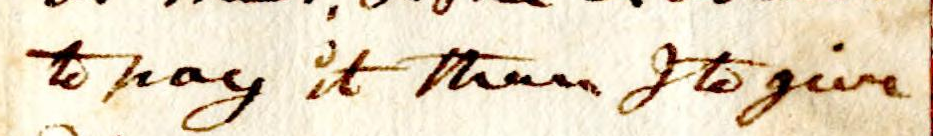to pay it than I to give
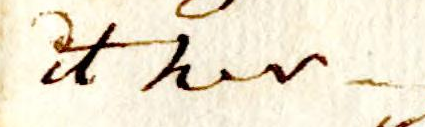it her-
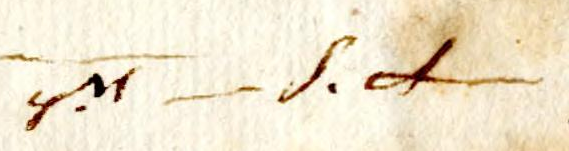yrs. S.A.
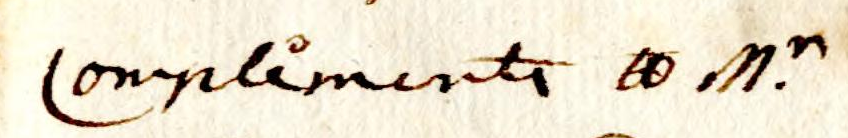Complements to M^r.
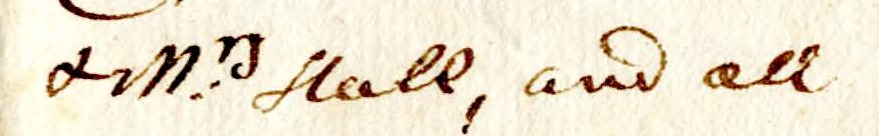& M^rs. Hall, and all
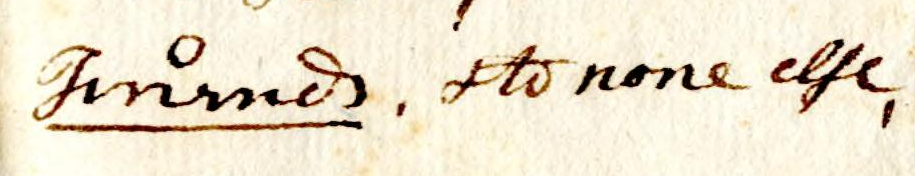Friends, & to none else,
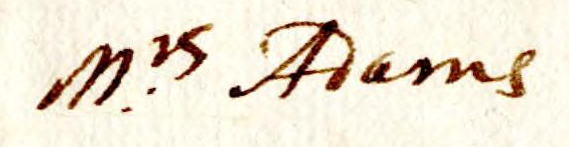M^rs: Adams
